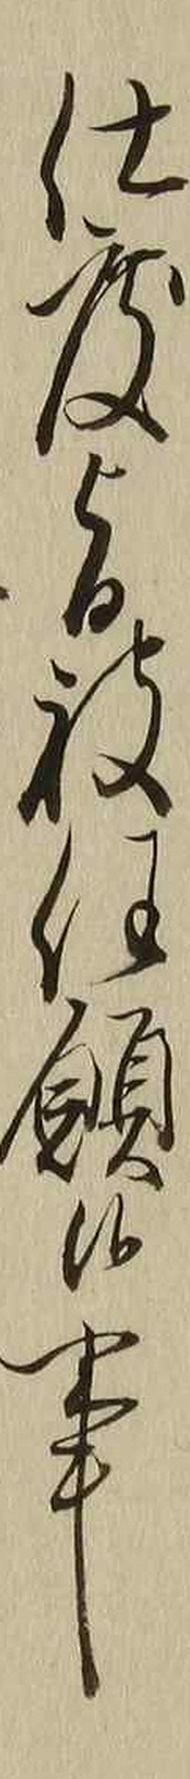仕度旨被任願候事
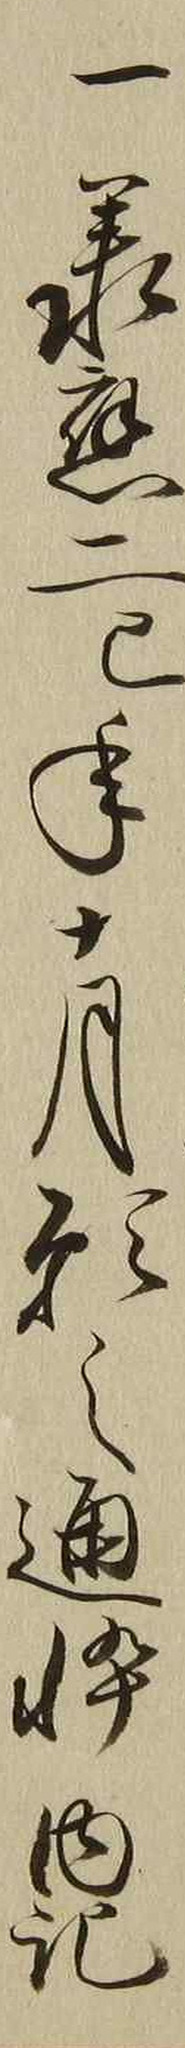一承応二巳年十月願之通忰内記
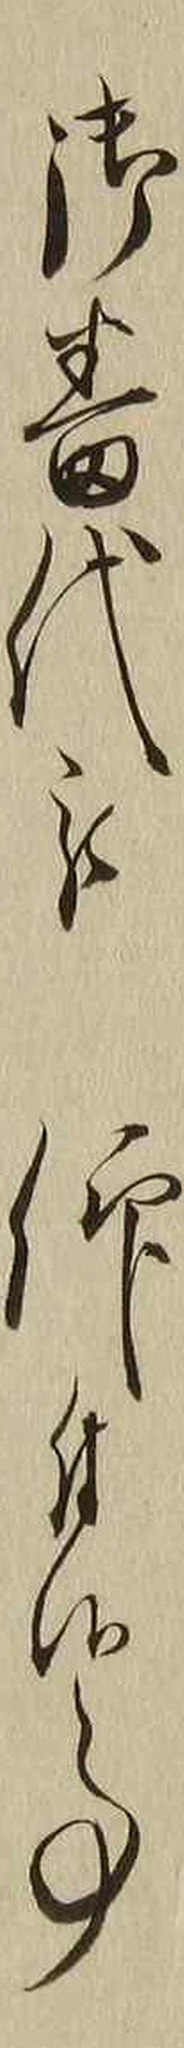御番代被仰付候事
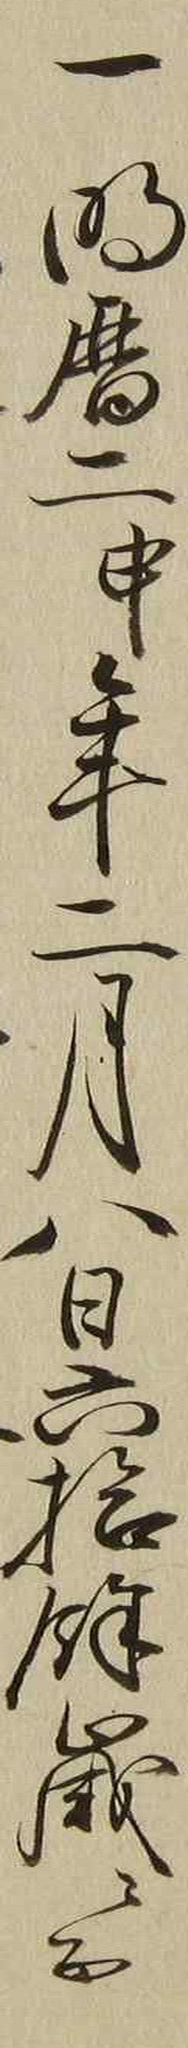一明暦二申年二月八日六拾餘歳に而
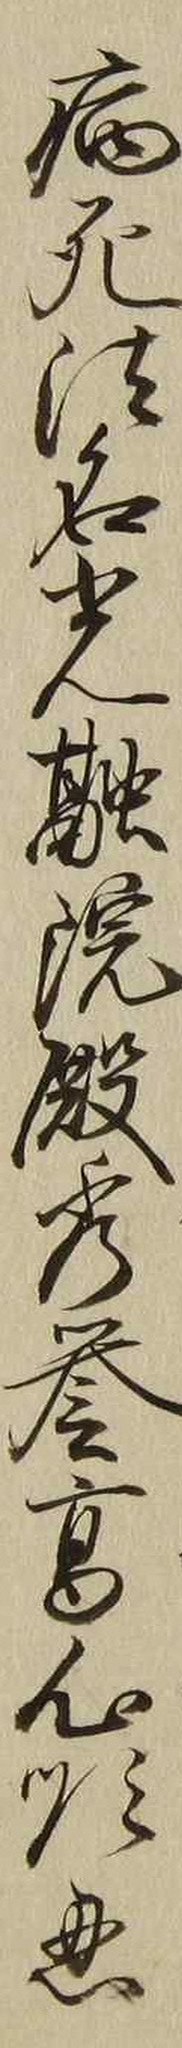病死法名光融院殿秀誉高心順忍
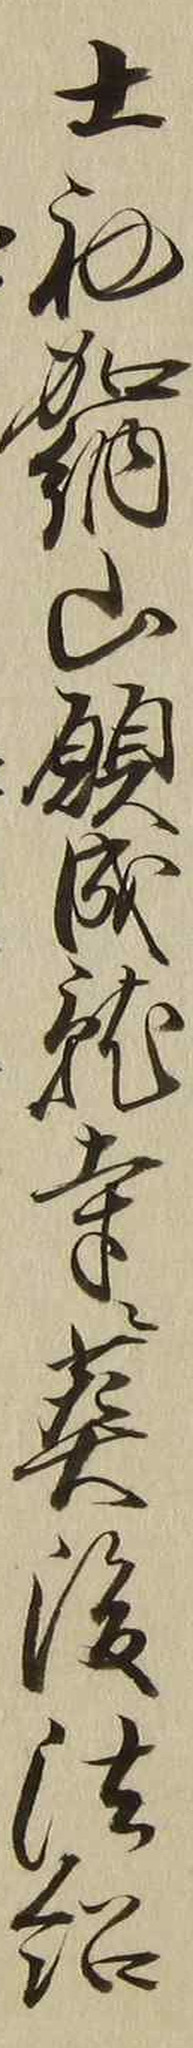士初加納山願成就寺に葬後法招
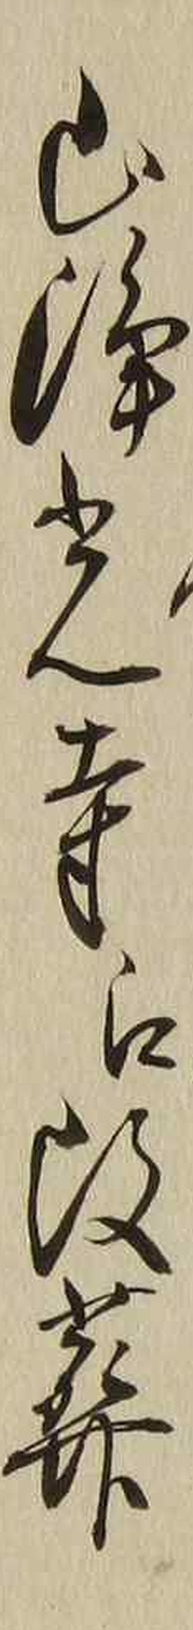山浄光寺江改葬
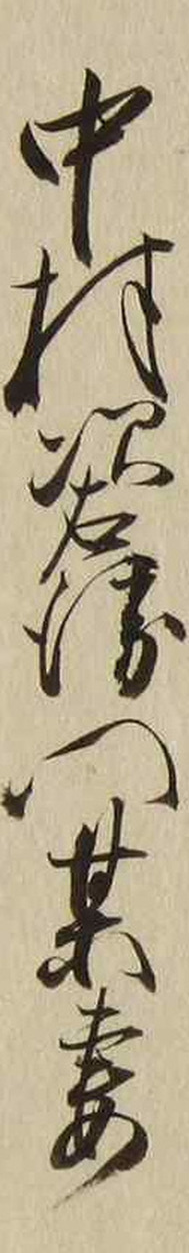女中村次右衛門某妻

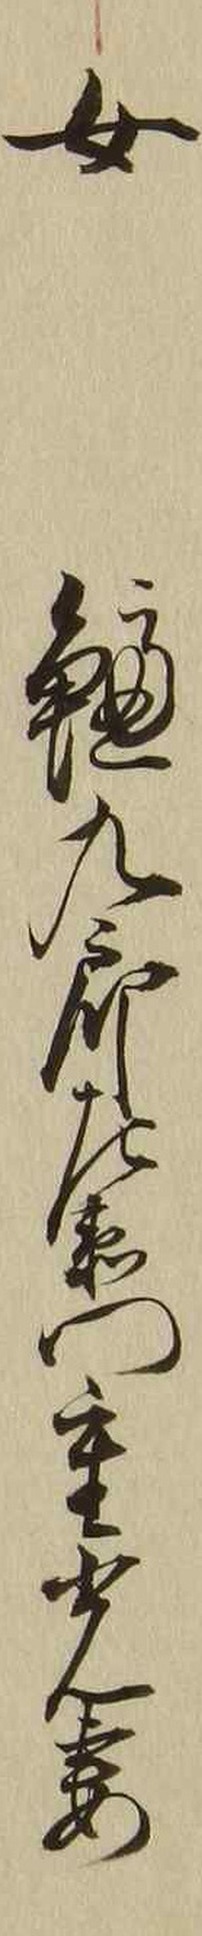女鱸九郎左衛門重光妻
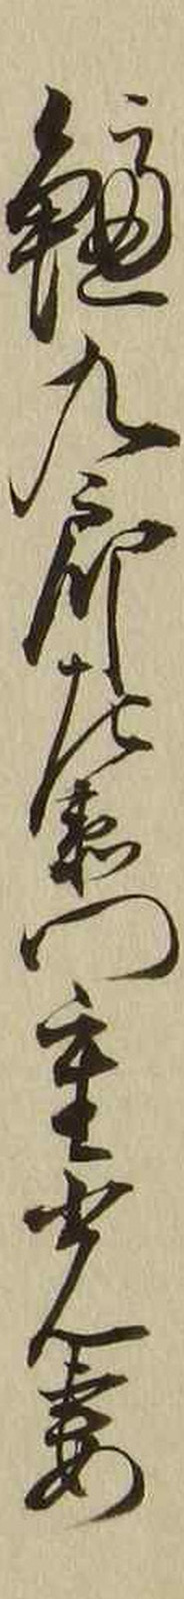女鱸九郎左衛門重光妻
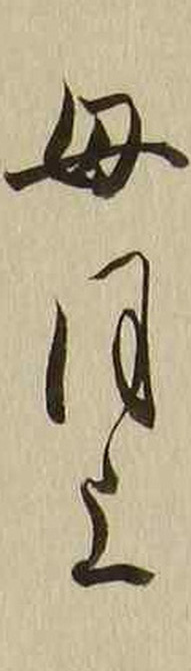母同上
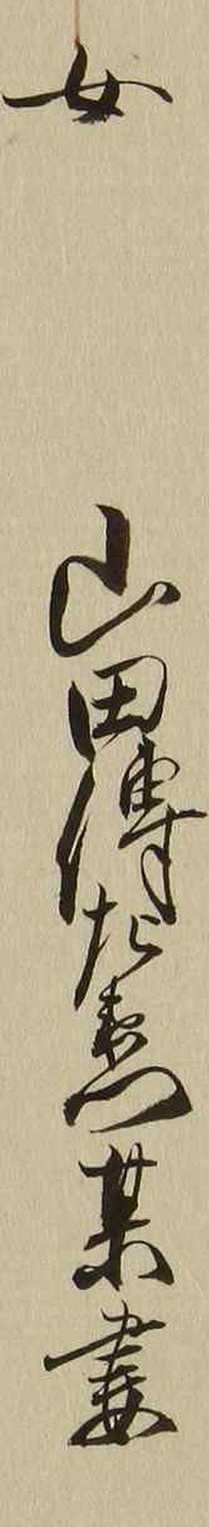女山田伝左衛門某妻
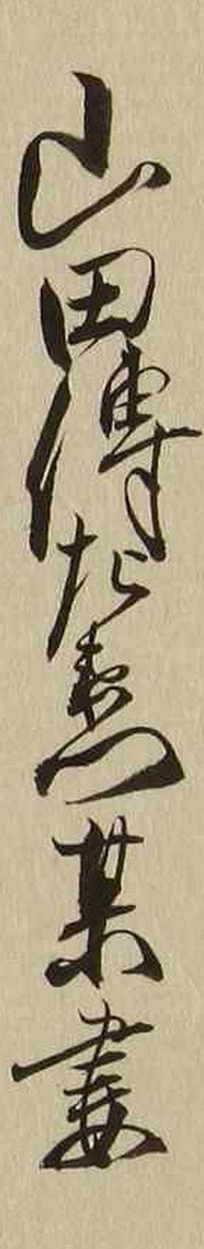女山田伝左衛門某妻
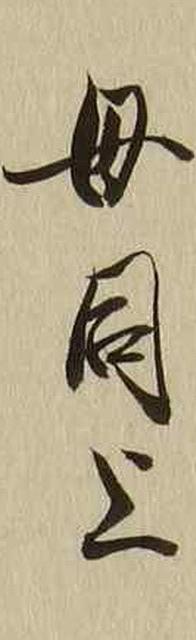母同上
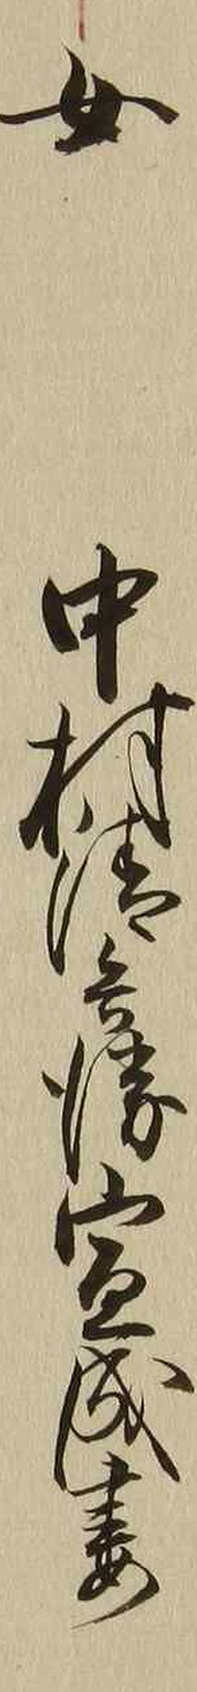女中村清兵後宣成妻
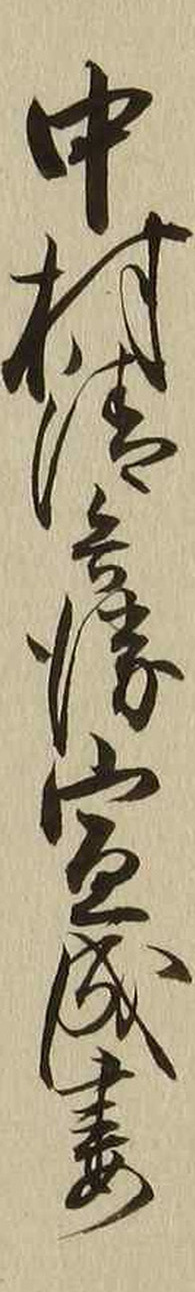女中村清兵後宣成妻
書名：諸士系譜　巻之77　を之部11
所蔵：会津若松市立会津図書館
